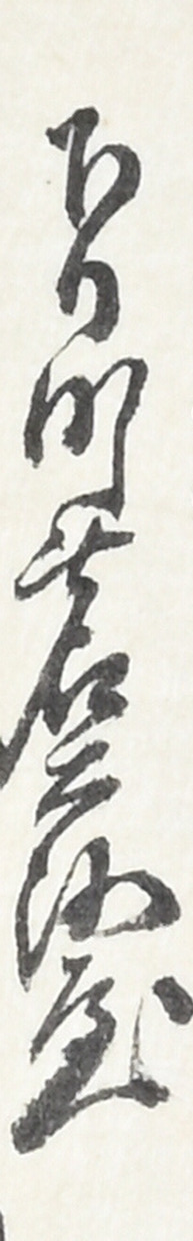下モ町茗荷屋
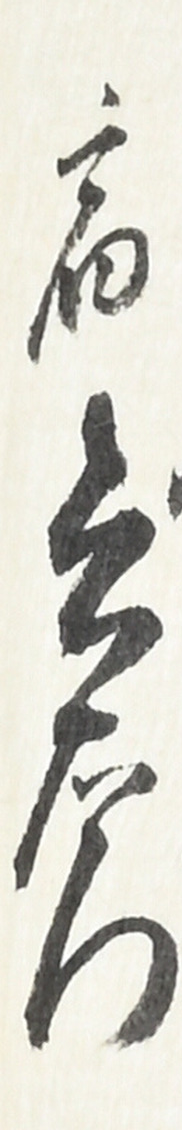宿金右衛門
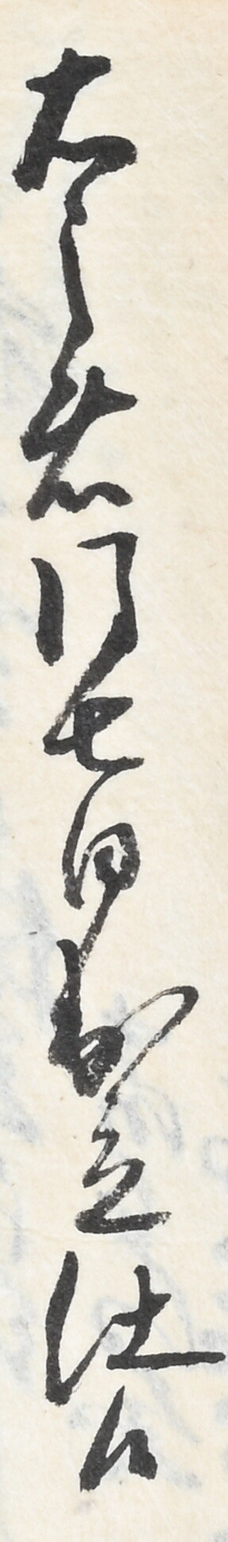右之者同十六日出立仕候
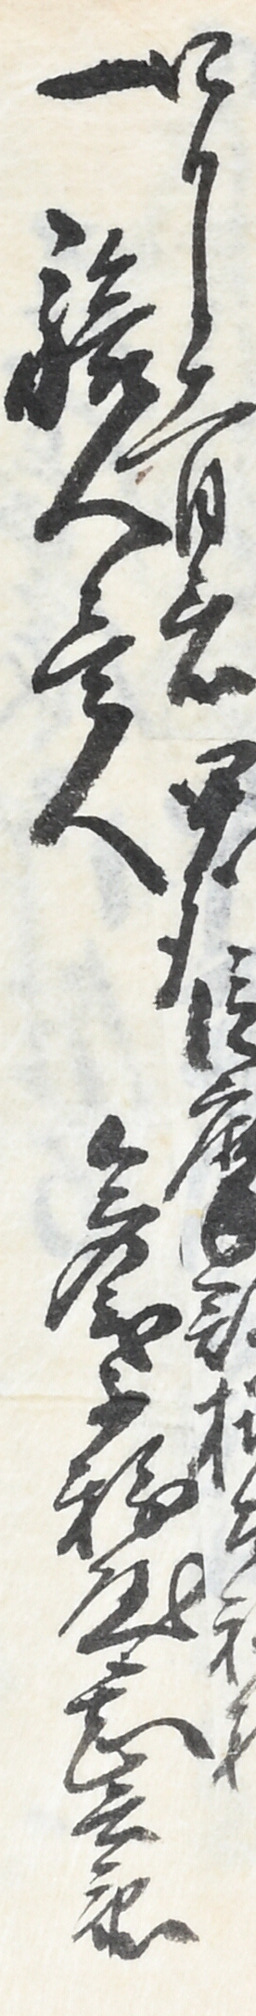一旅人壱人近江屋利兵衛

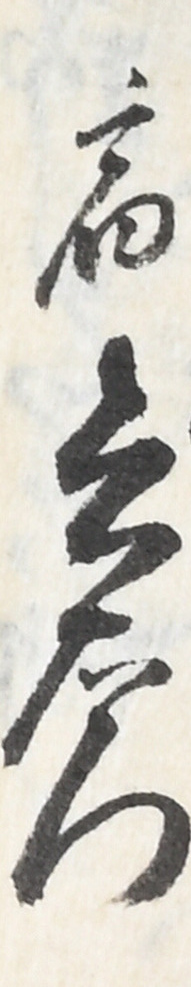宿吉左衛門
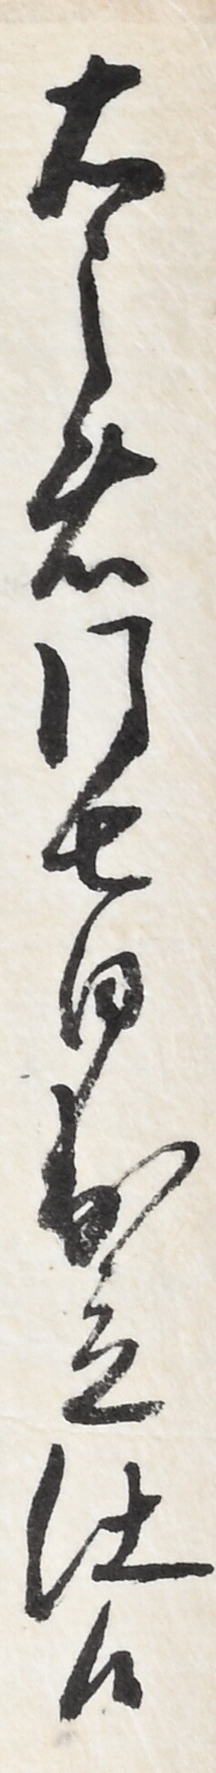右之者同七日出立仕候
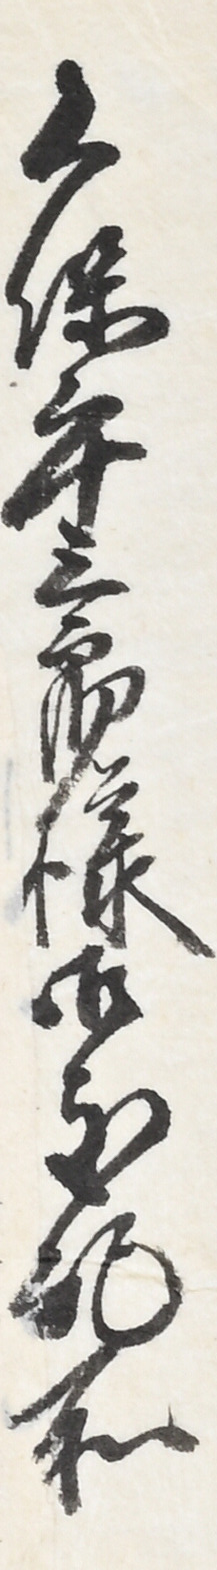久保平三郎様御支配所
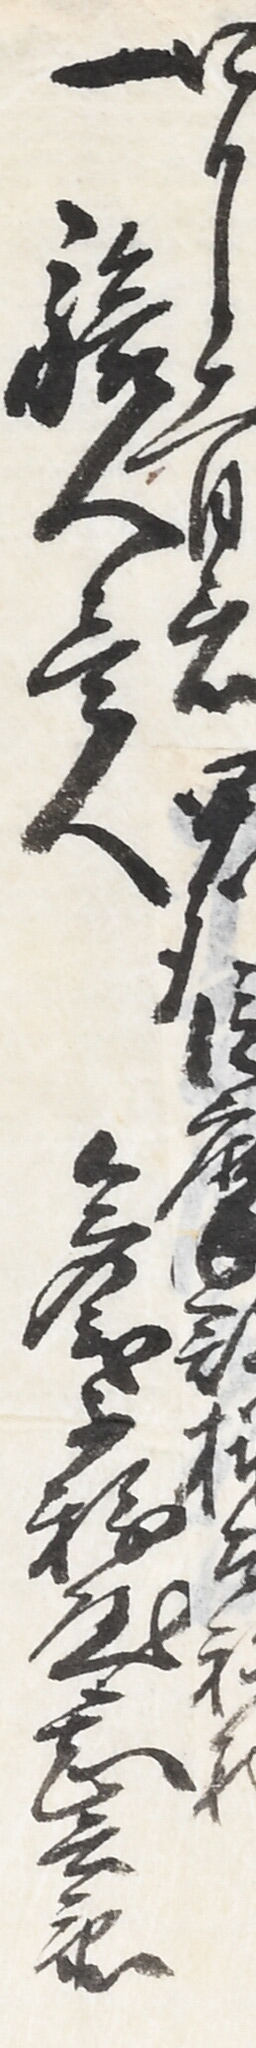一旅人壱人多葉粉屋甚兵衛
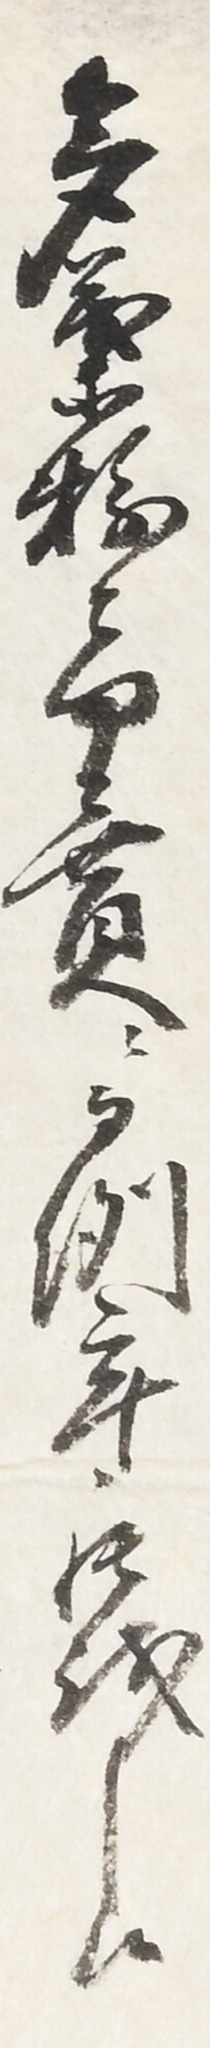多葉粉商売ニ而例年罷越申候
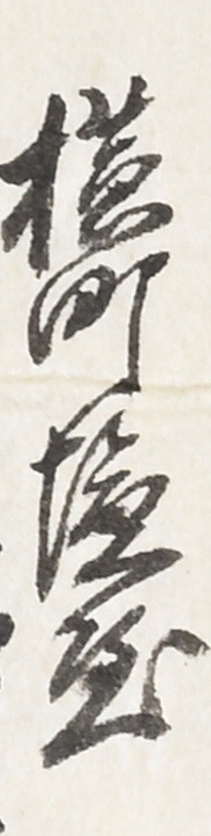横町塩屋
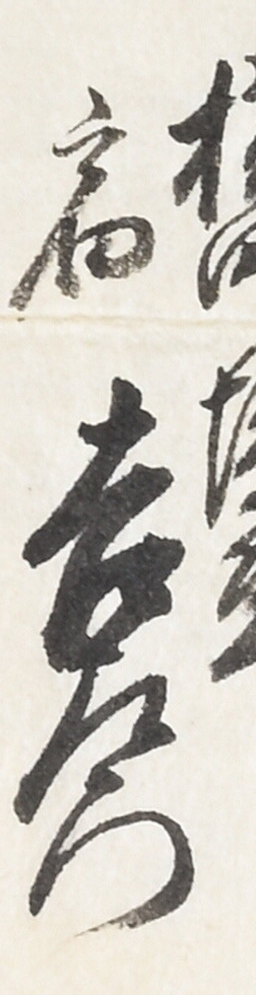宿吉左衛門
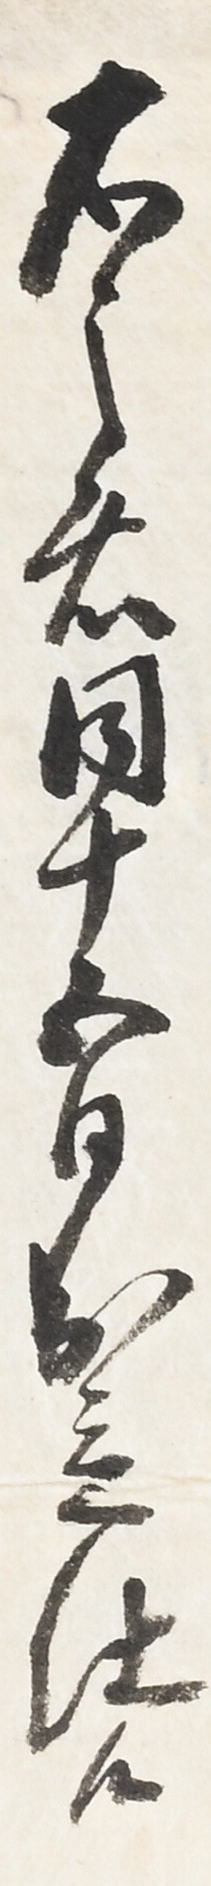右之者同十五日出立仕候
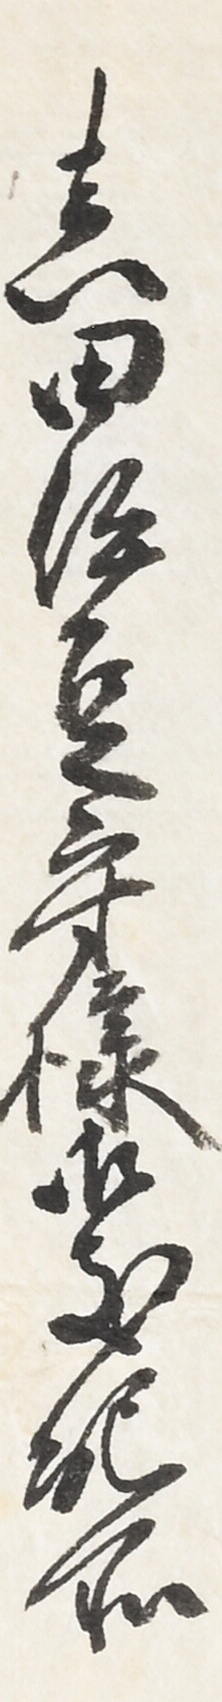真田伊豆守様御支配所
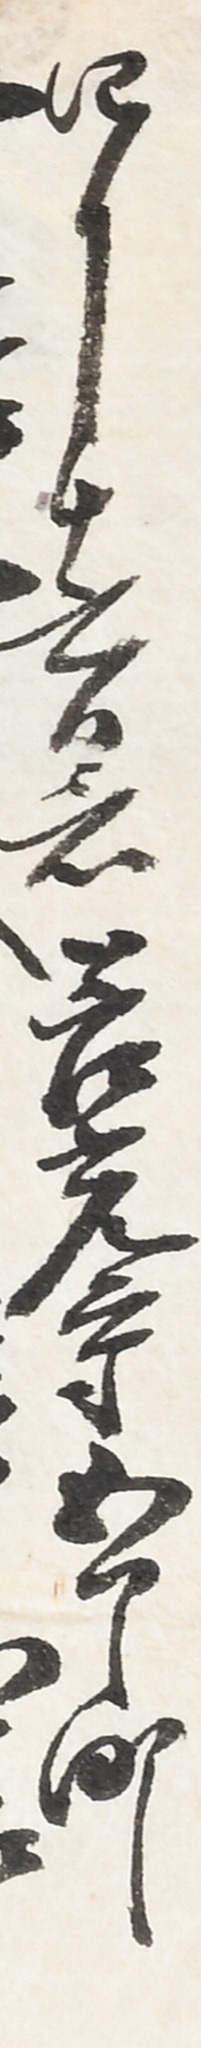四月十六日着善光寺五丁町
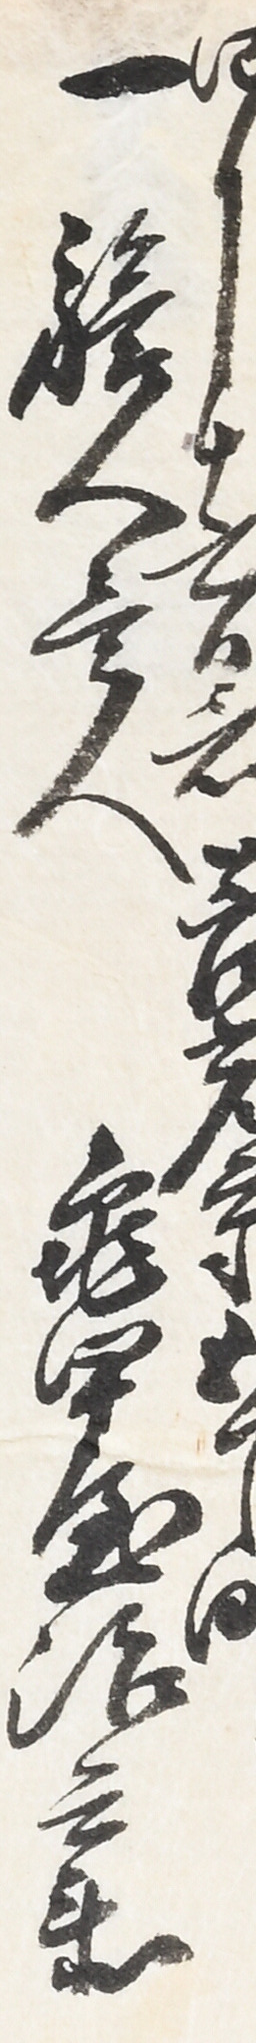一旅人壱人亀甲屋治兵衛
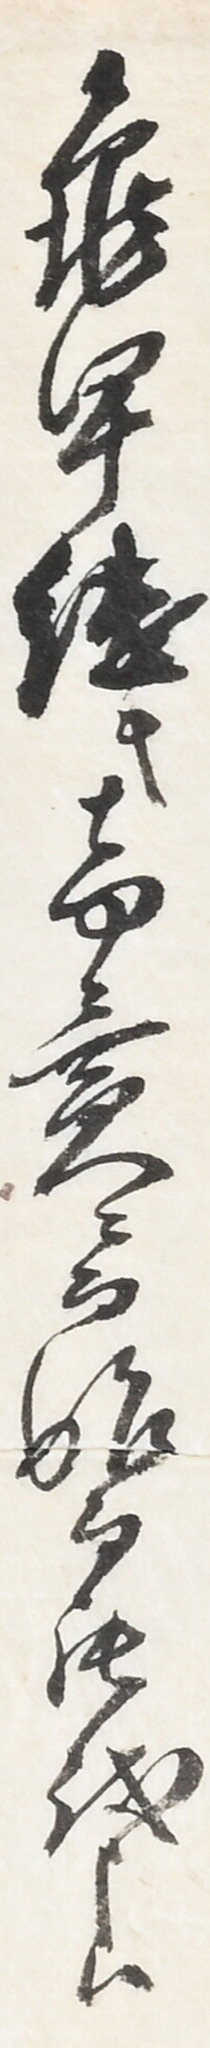亀甲継キ商売ニ而始而罷越申候
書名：旅人泊控帳
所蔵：伊那市立高遠町図書館・合同会社AMANE
